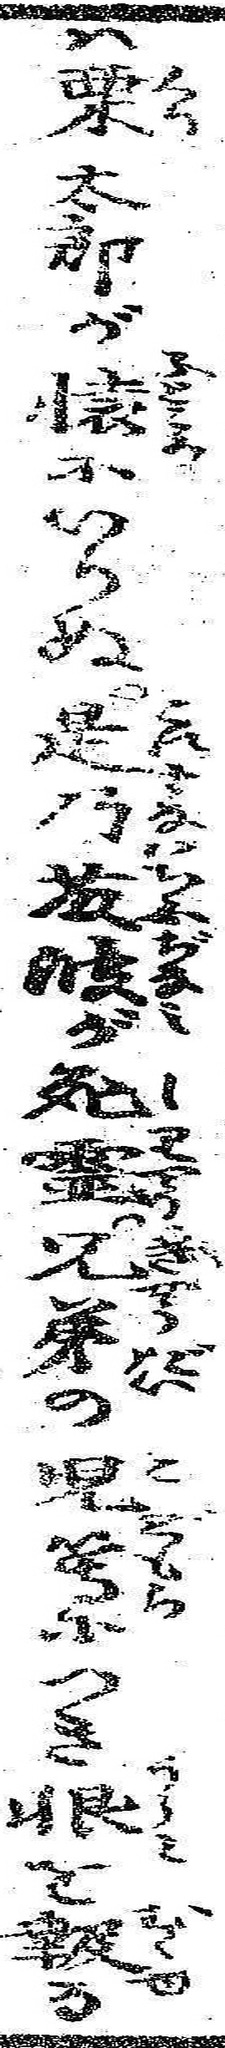は栗太郎が懐にいりぬ。是乃藤波が死霊。兄弟の児等につき恨を報る
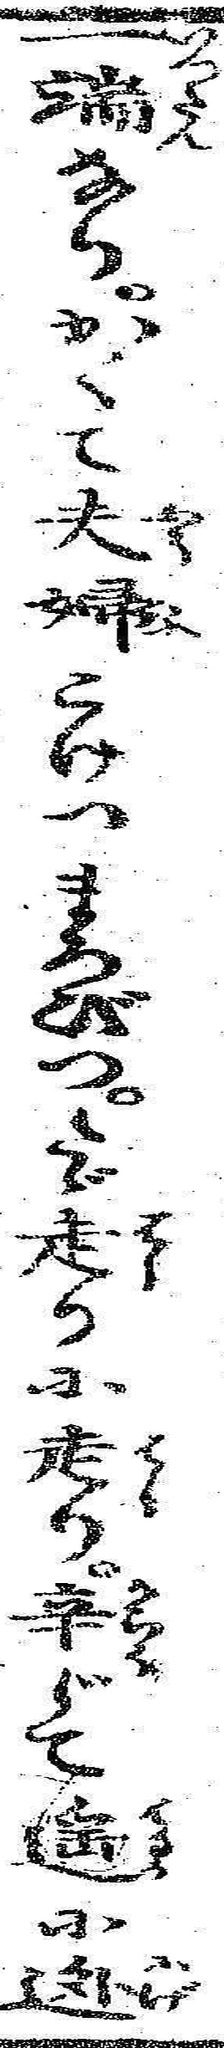一端なり。かくて夫婦こけつまろびつ。たゞ走りに走り。辛じて遥に逃
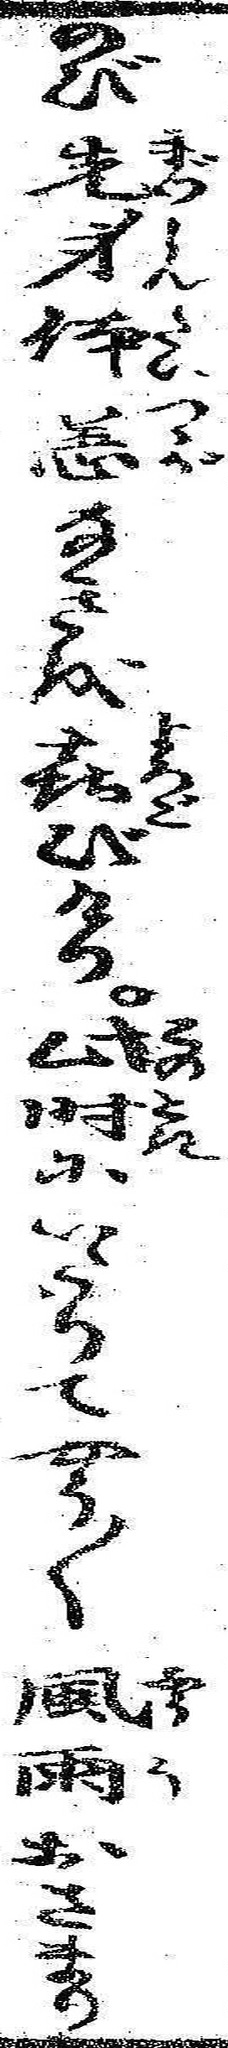のび先身体恙なきを喜びけり。此時にいたりてやう〳〵風雨おさまり
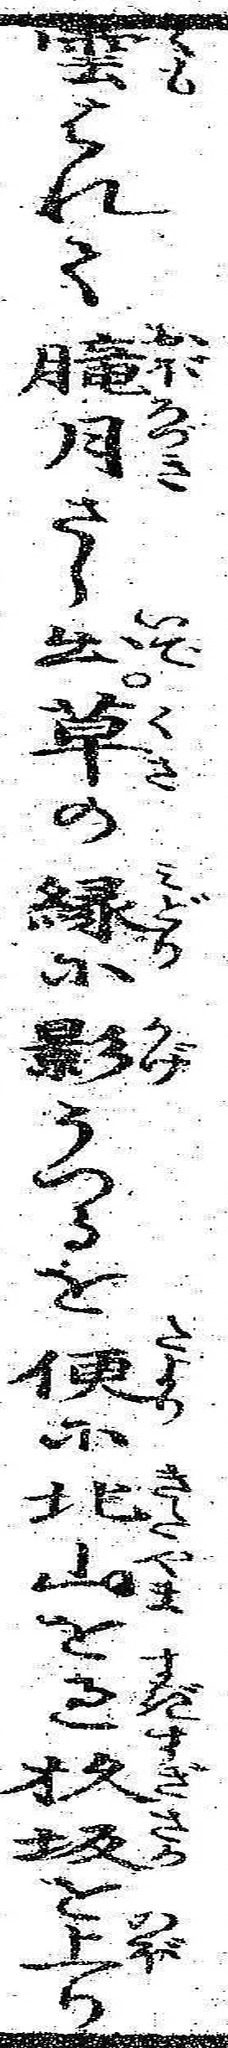雲はれて朧月さし出。草の緑に影うつるを便に北山を過杉坂を上り
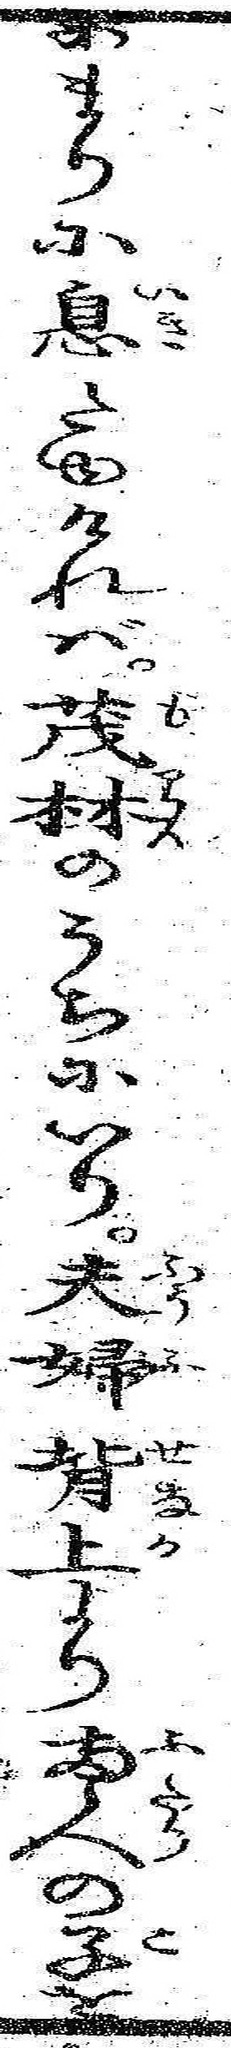あまりに息たゆければ。茂林のうちにいり。夫婦背上より両人の子を
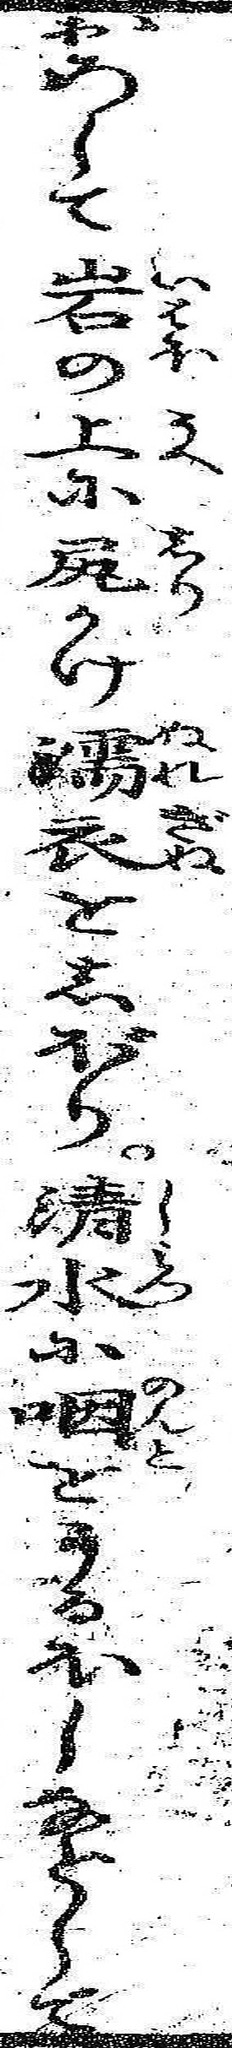おろして岩の上に尻かけ濡衣をしぼり。清水に咽をうるほしなとして
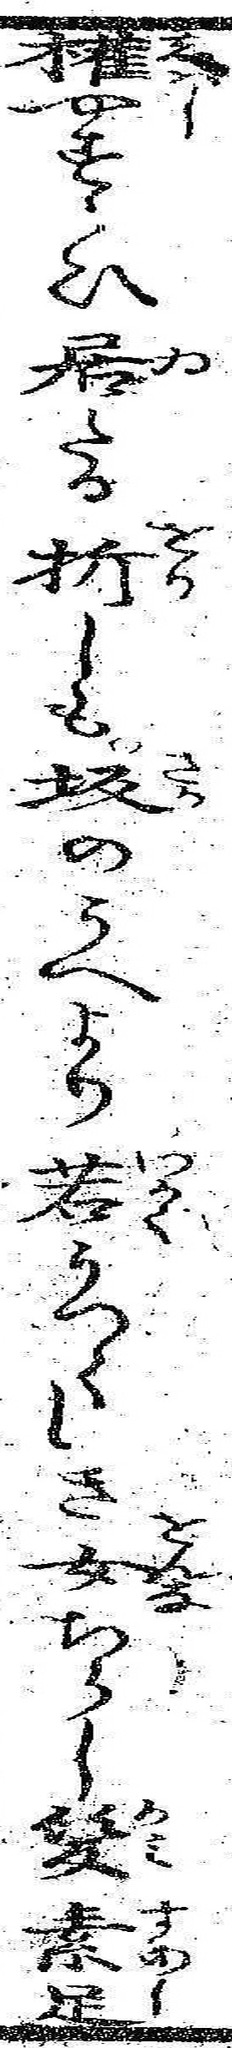権やすらひ居たる折しも。坂のうへより若うつくしき女ちらし髪素足
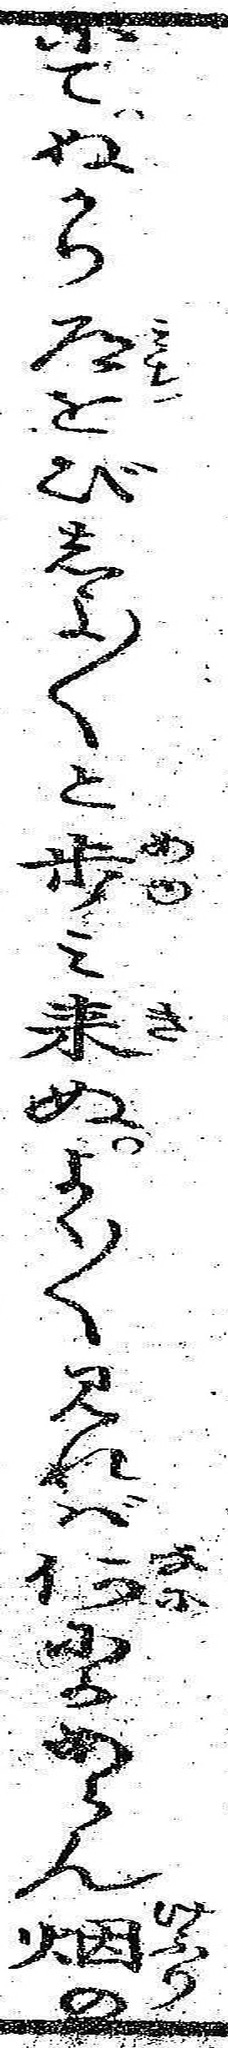にて。ぬかり道をびしよ〳〵と歩み来ぬ。よく〳〵見れば何にかあらん煙の
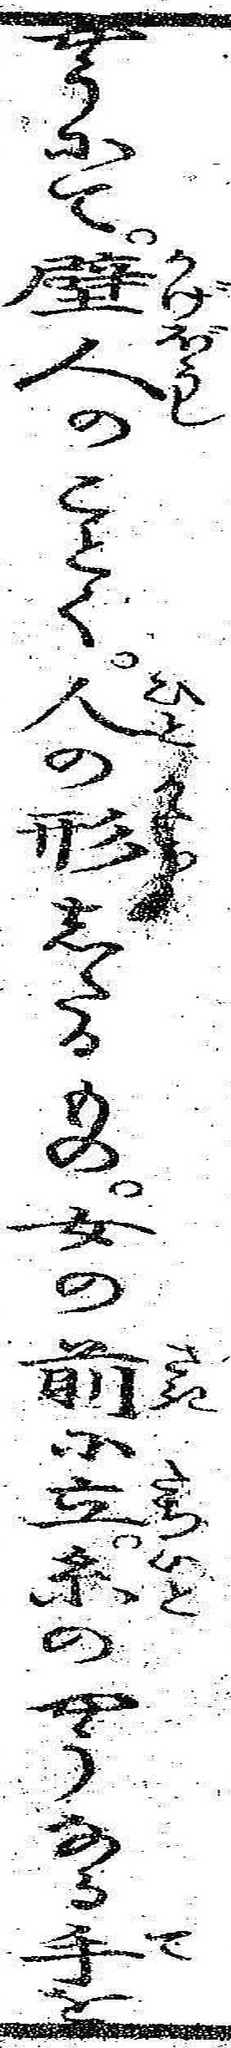やうにて。壁人のことく。人の形したるもの。女の前に立。糸のやうなる手を
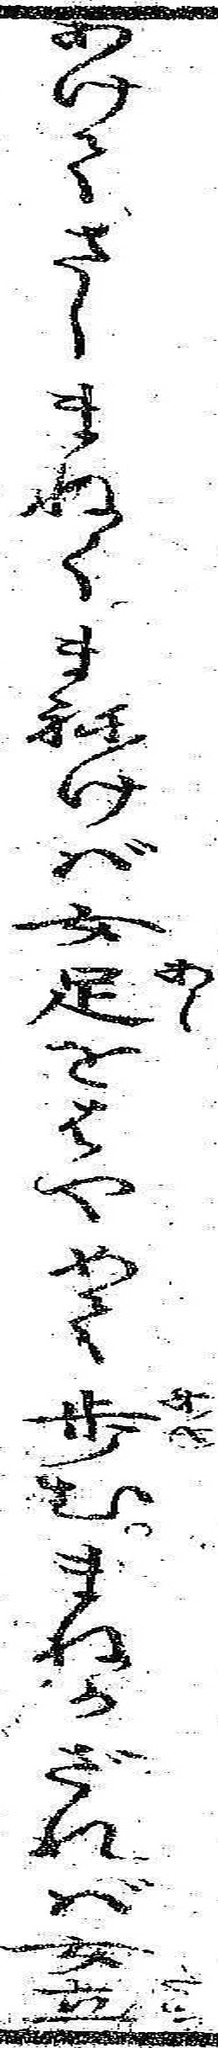あけてさしまねく。まねけば女足をはやめて歩む。まねかざれば女立
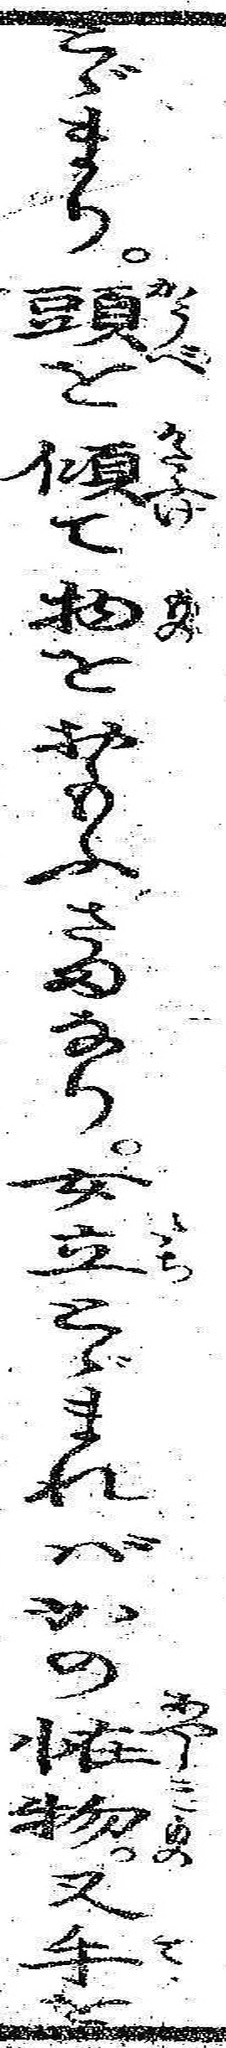とゞまり。頭を傾て物をおもふさまなり。女立とゞまればかの怪物。又手を
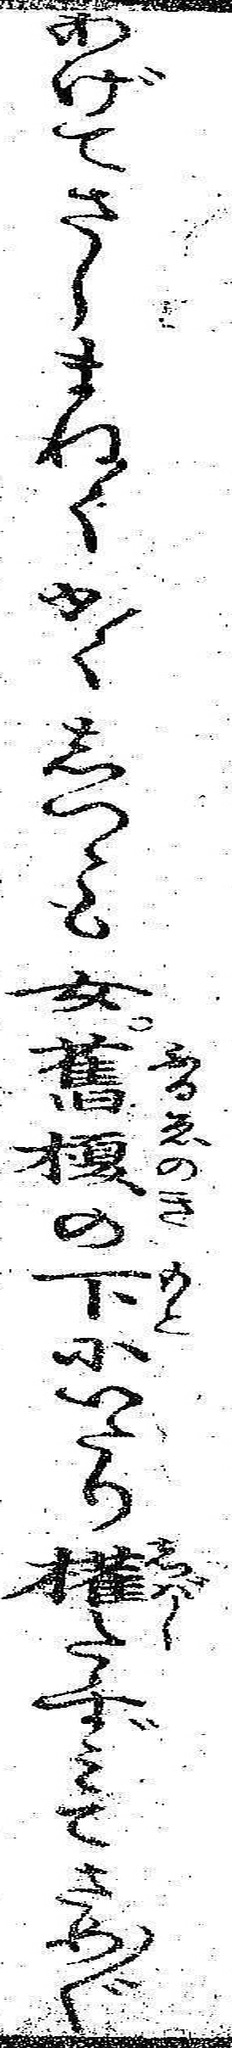あげてさしまねくかくしつゝも女。旧榎の下にいたり権たゝずみてさめ〴〵
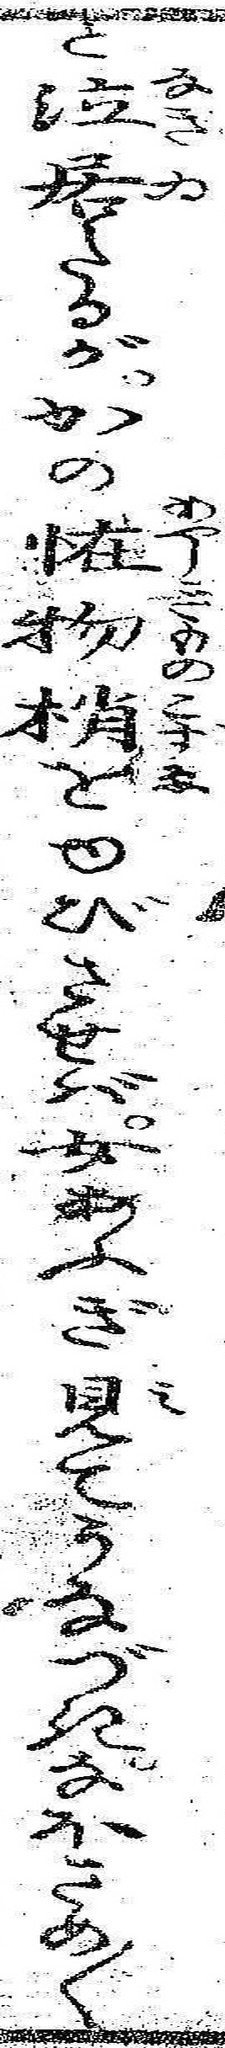と泣居たるが。かの怪物梢をゆびさせば。女あふぎ見てうなづき。なほさめ〴〵
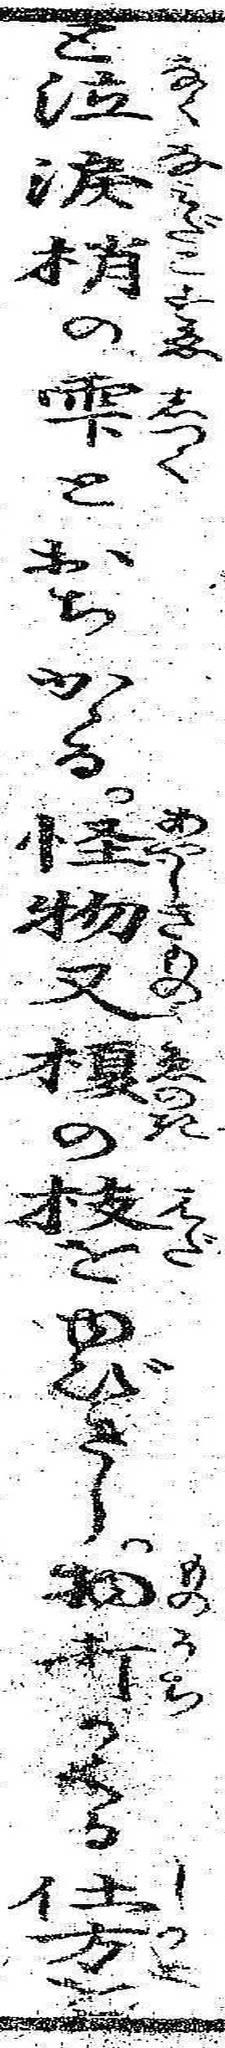と泣涙梢の雫とおちかゝる。怪物又榎の枝をゆびさし。物打かくる仕方を

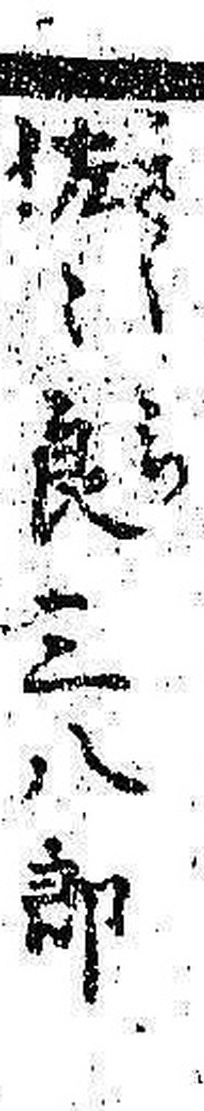佐々良三八郎
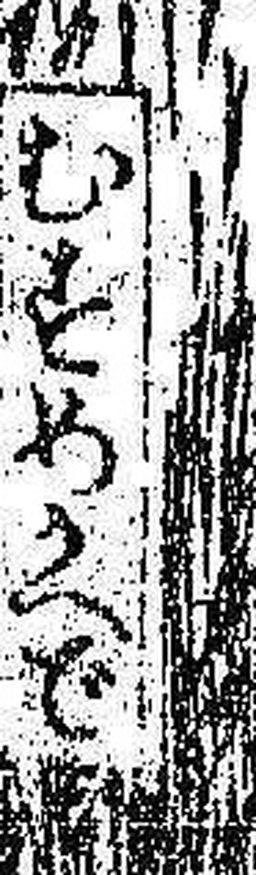むすめかへで
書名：昔話稲妻表紙
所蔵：国文学研究資料館
